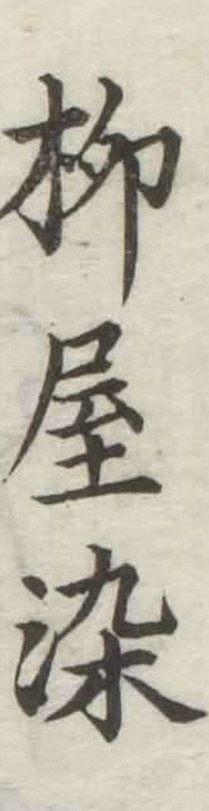柳屋染
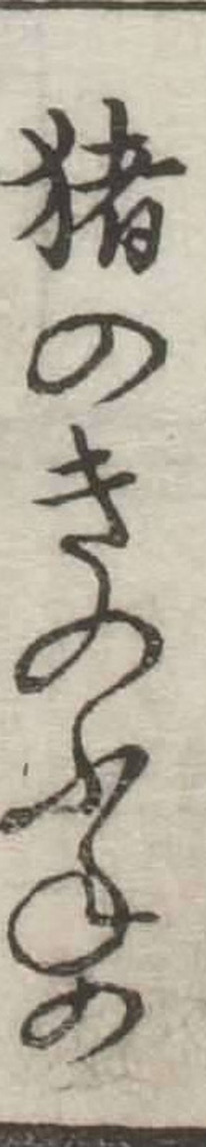猪のきのふねの
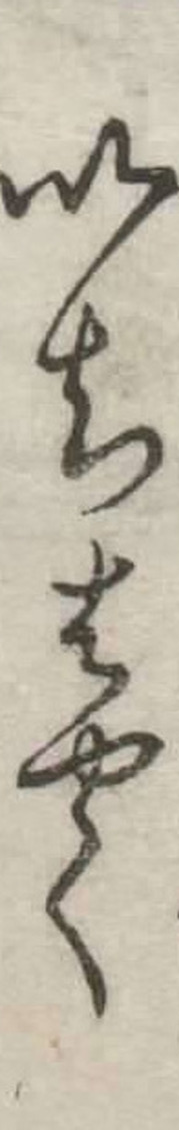いちはやく
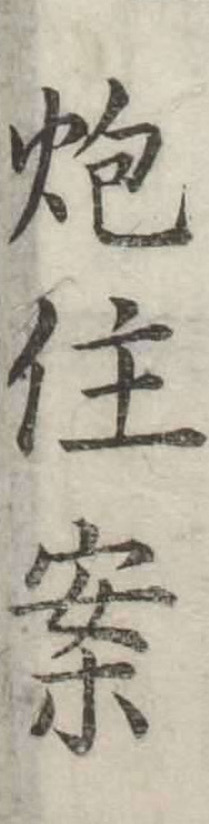炮住案
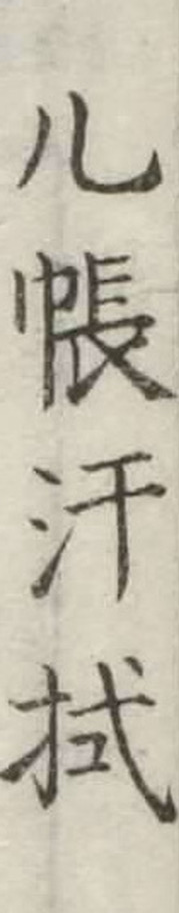几帳汗拭
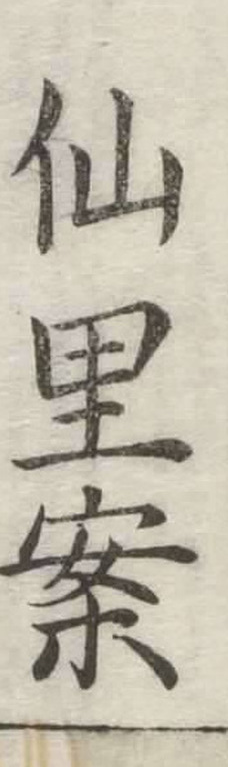仙里案
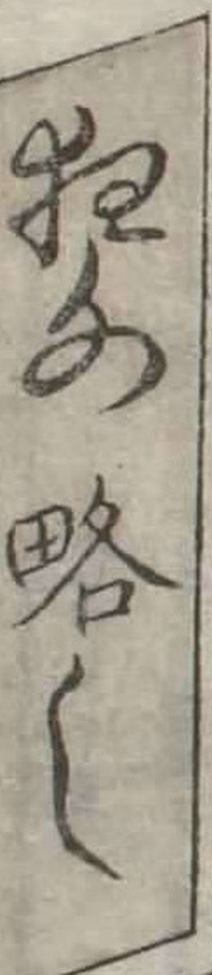狂文略之

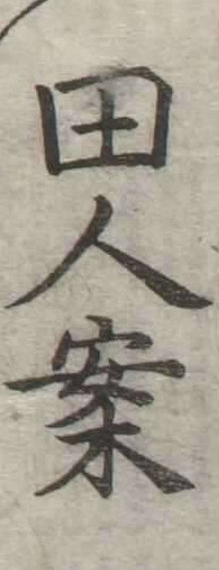田人案
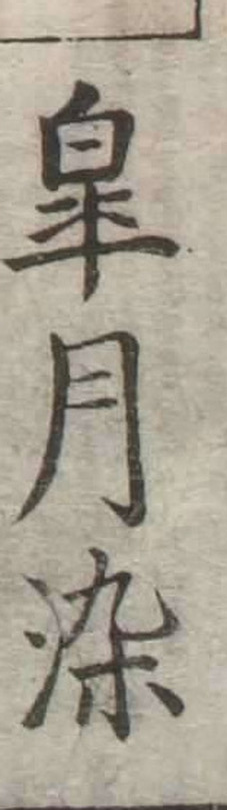皐月染
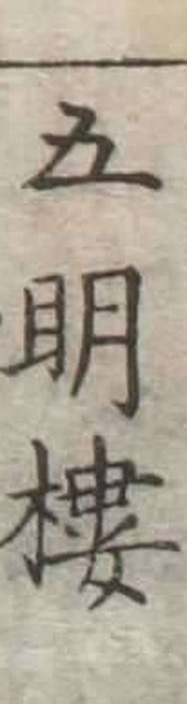五明楼
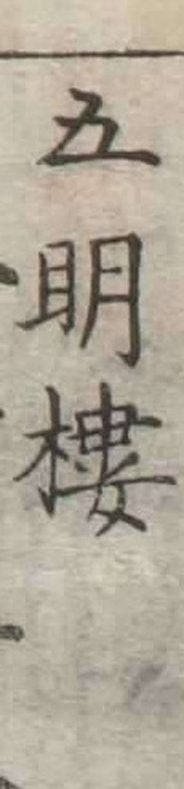五明楼
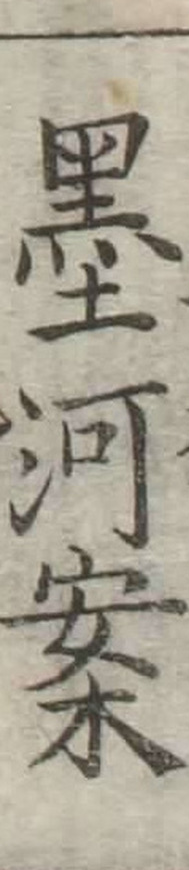墨河案
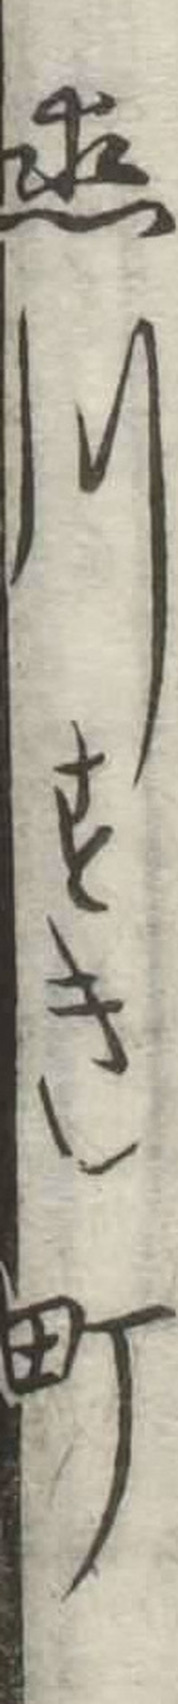恋川すき町
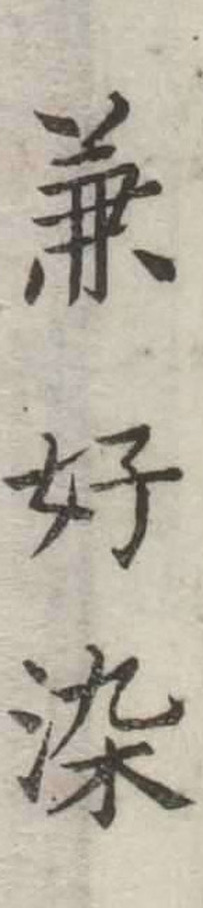兼好染
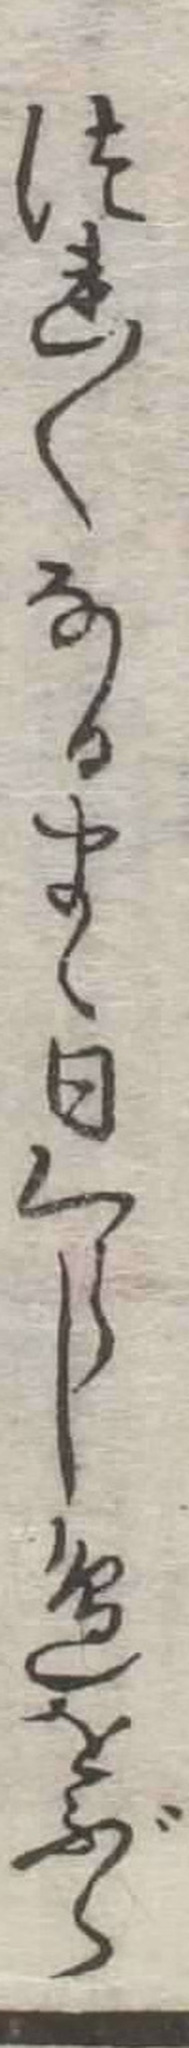つれ〳〵なるまゝ日くらし辺をぶら
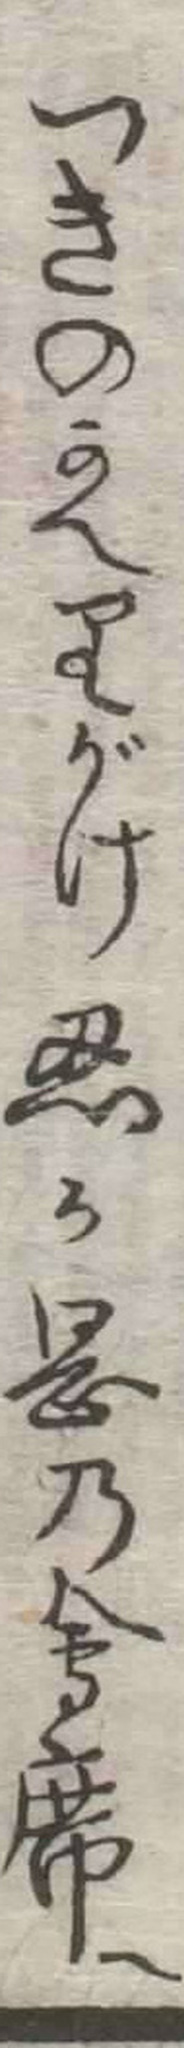つきのかへりがけ忍か岡の会席へ
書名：たなくひあわせ
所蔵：国文学研究資料館
